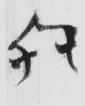夂
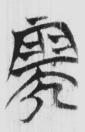需
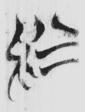{鳥八二}
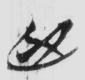臣
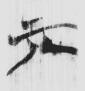亓
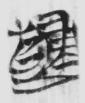歸
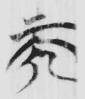而
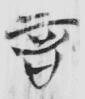言
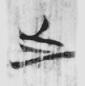之
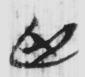臣
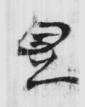見
